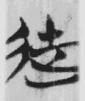徒
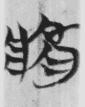{爿兔}
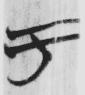于
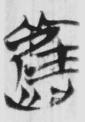舊
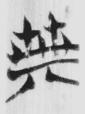典
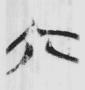六
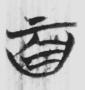百
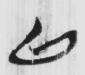㠯（以）
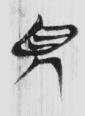{目人}
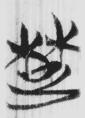楚
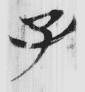子
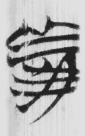義
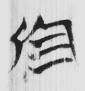於
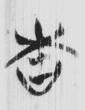{本口}
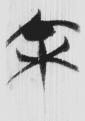會
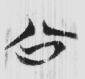公
